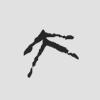大
